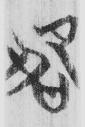卲
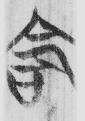命
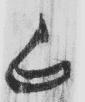㠯（以）
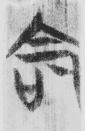命
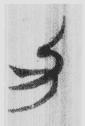力
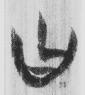曰
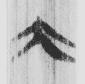大
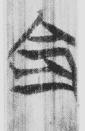命
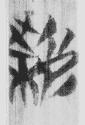殜
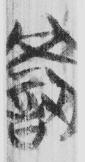罰
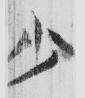少
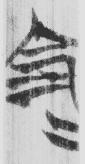命=
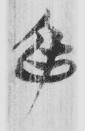身
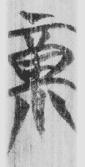福
